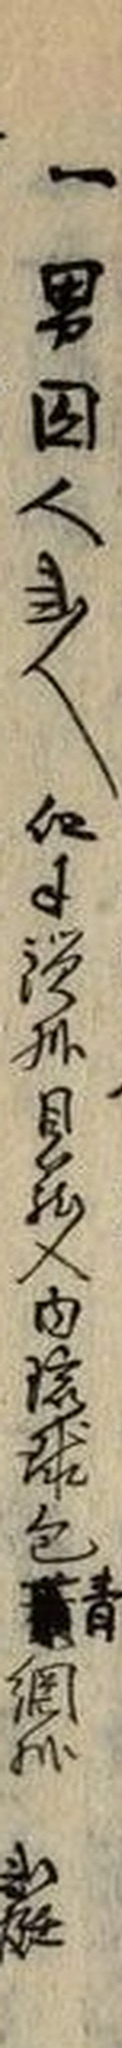一男囚人弐人但手鎖掛目籠入内琉球包青網掛弐挺
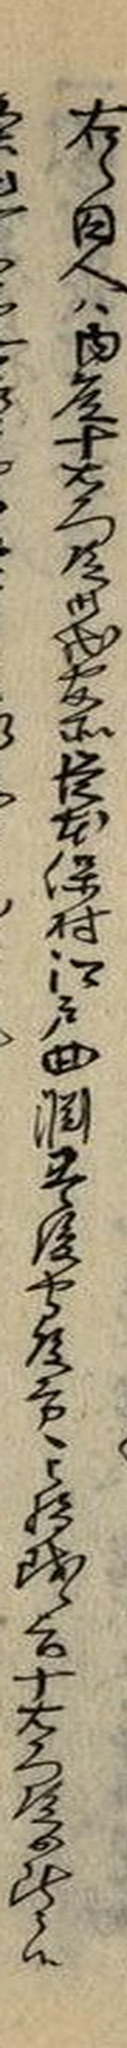右之囚人ハ内藤十右衛門殿御代官所従本保村江戸曲渕豊後守殿方へ被指越候旨十右衛門殿ゟ断ニ候
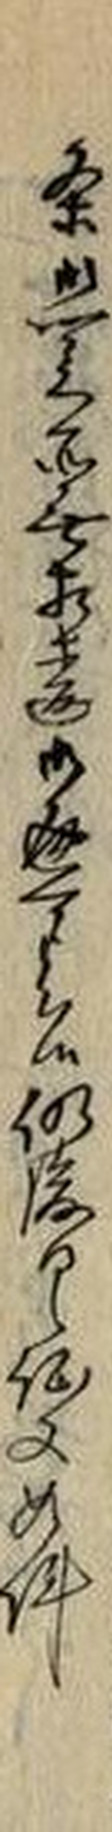条御関所無相違御通可被下候仍後日之証文如件
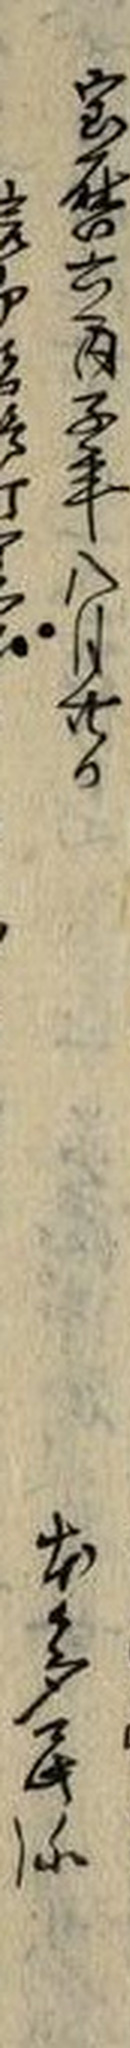宝暦六丙子年八月廿日芦田図書
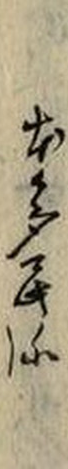本多民弥
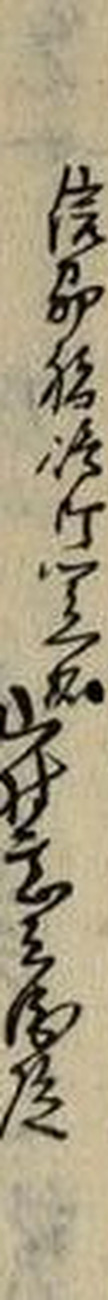信州福嶋御関所山村甚兵衛殿
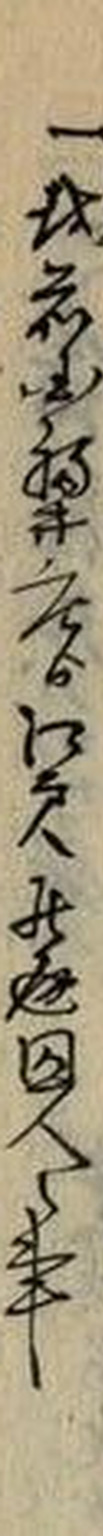越前国福井庄ゟ江戸へ罷通囚人之事
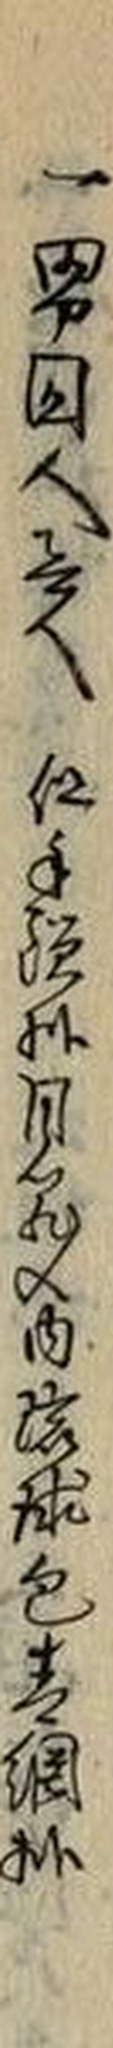一男囚人壱人但手鎖掛目籠入内琉球包青網掛
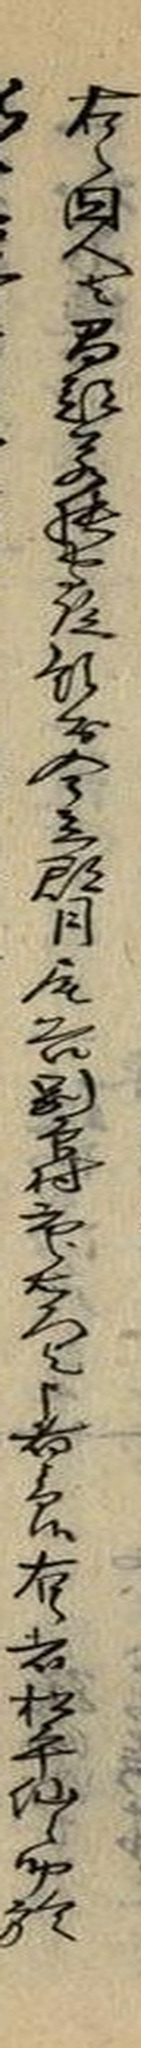右之囚人者間部若狭守殿領分今立郡月尾谷別印村市右衛門与申者ニ而候右之者松平仙之助於
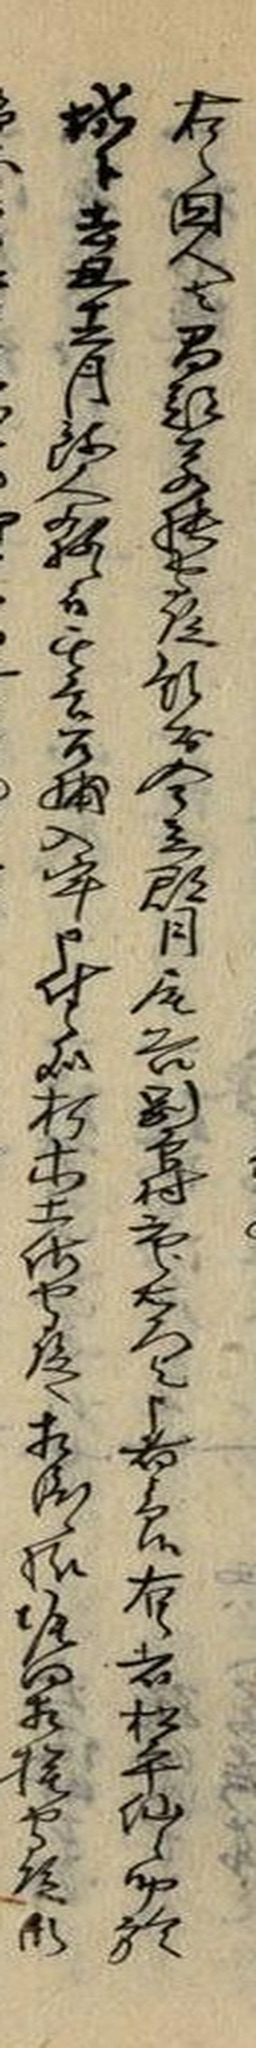城下去丑十二月致人殺候ニ付其節召捕入牢申付候処朽木土佐守殿へ相渡候様堀田相模守殿御
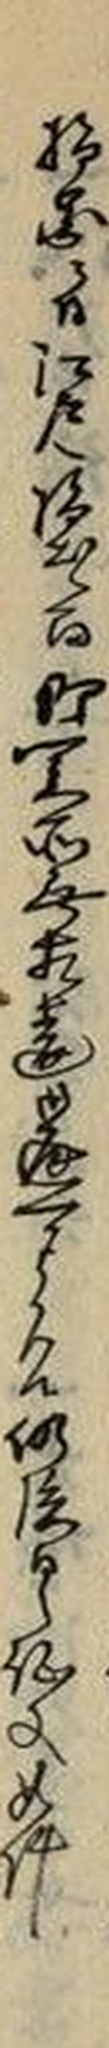指図ニ付江戸へ指出候間御関所無相違御通可被下候仍後日之証文如件
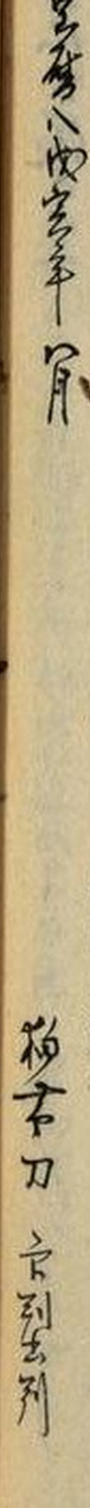宝暦八戊寅年八月狛帯刀印判書判
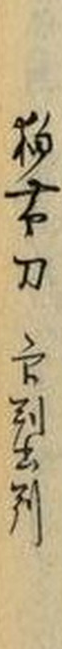狛帯刀印判書判
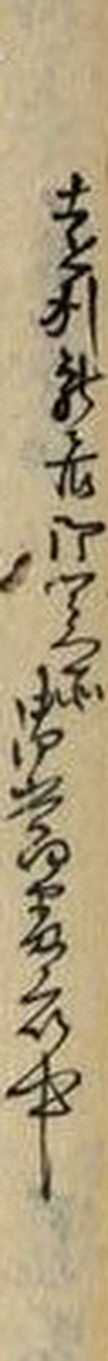遠州新居御関所御当番衆中
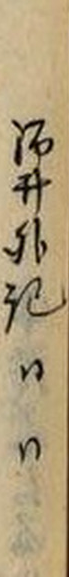酒井外記同同
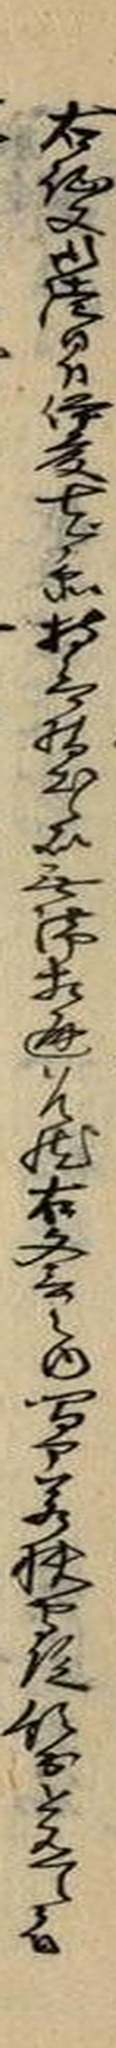右証文御徒目付伊藤七郎兵衛持参指出候処無滞相通乍然右文言之内間部若狭守殿領分と有之ニ付
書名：御国他国諸事之部
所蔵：福井県文書館 Fukui Prefectural Archives
